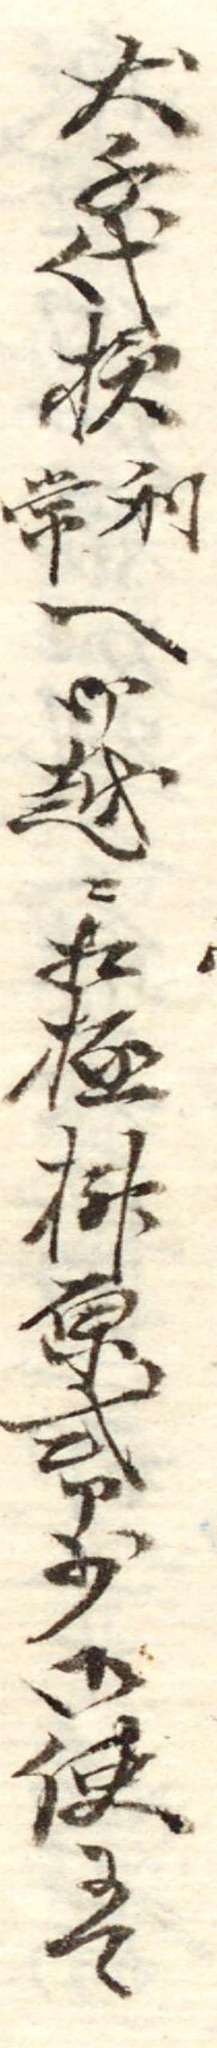犬千代様利常へ御越に相極榊原式部少御使尓て
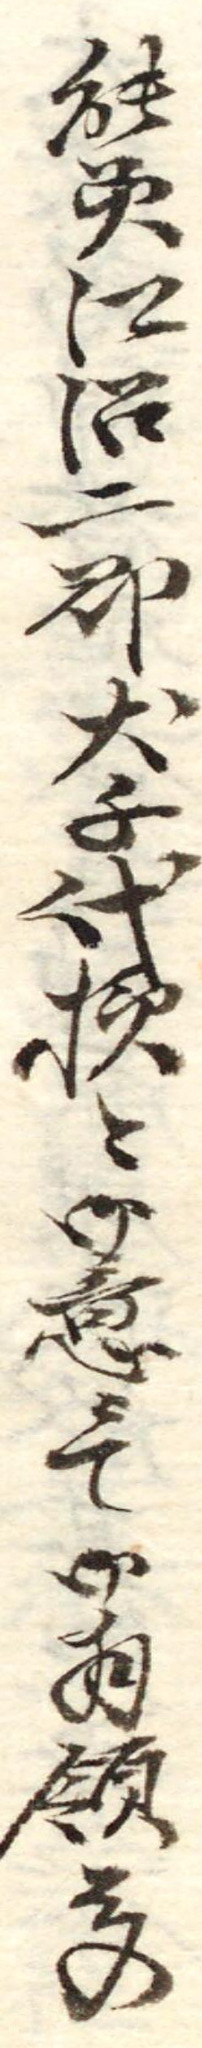能美江沼二郡犬千代様と御意にて御拝領その
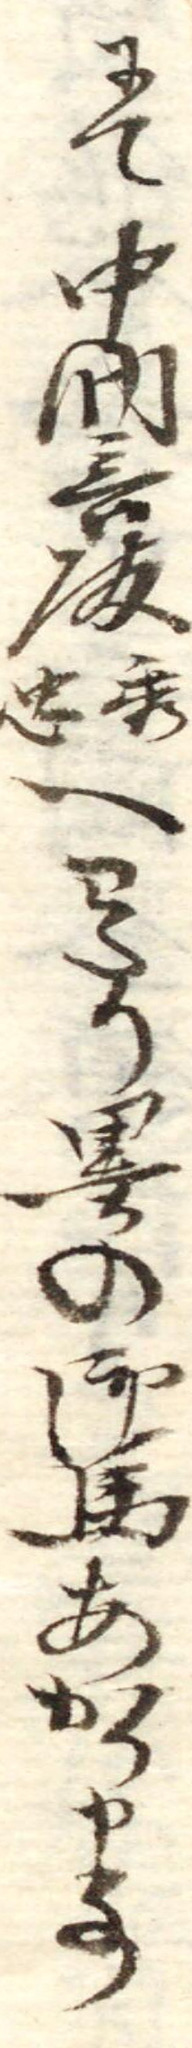尓て中納言殿秀忠へ己たり墨の御馬あかり申事
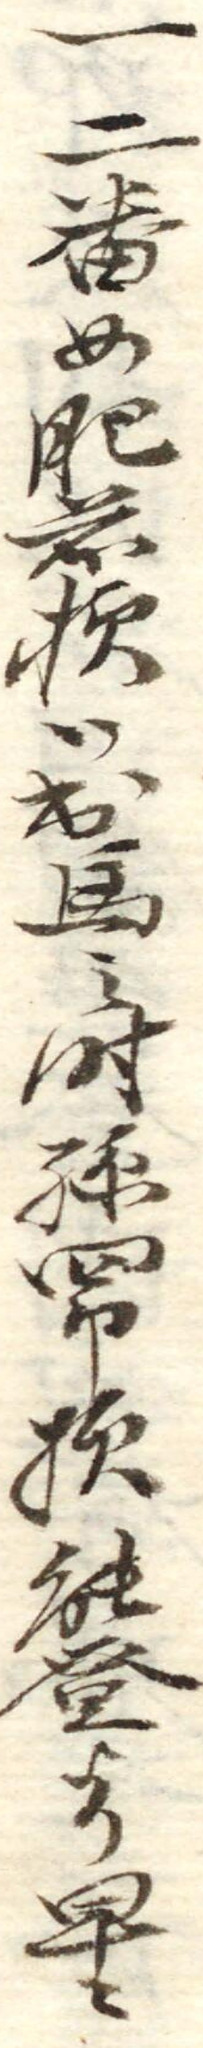一二番め肥前様は出馬之時孫四郎様能登より早々
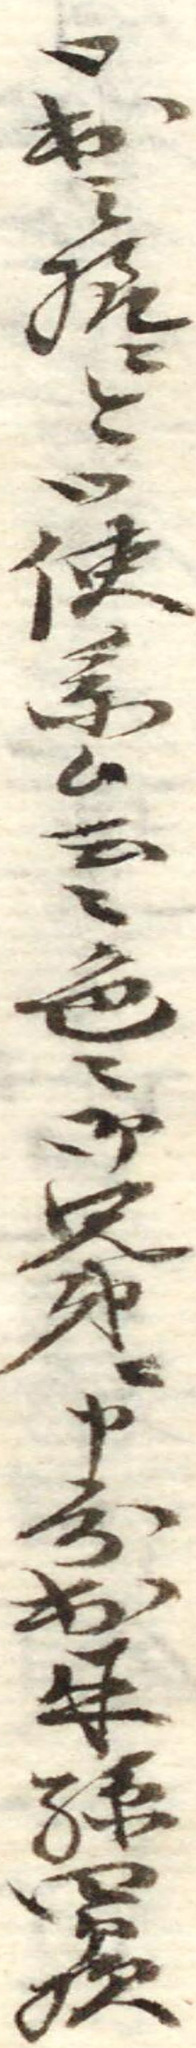御出之様にと御使参候云々色々御兄弟に申分出来孫四郎様
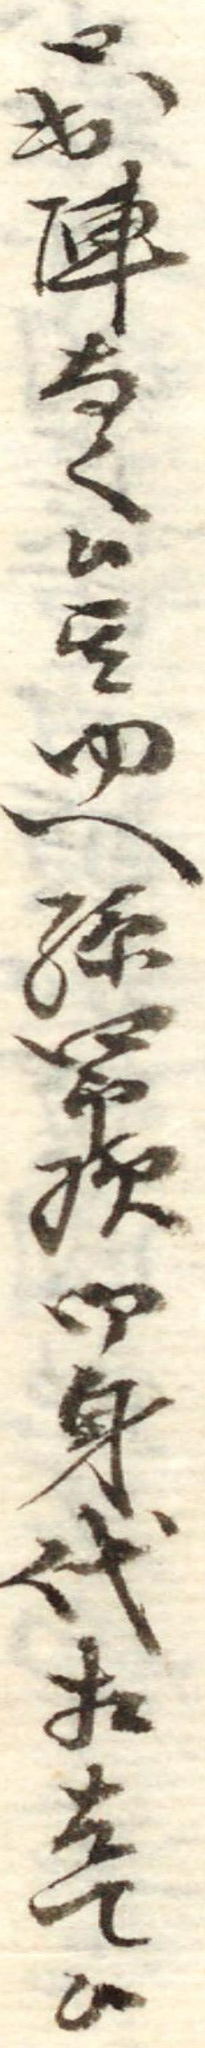御出陣なく候其ゆへ孫四郎様御身代相はて候
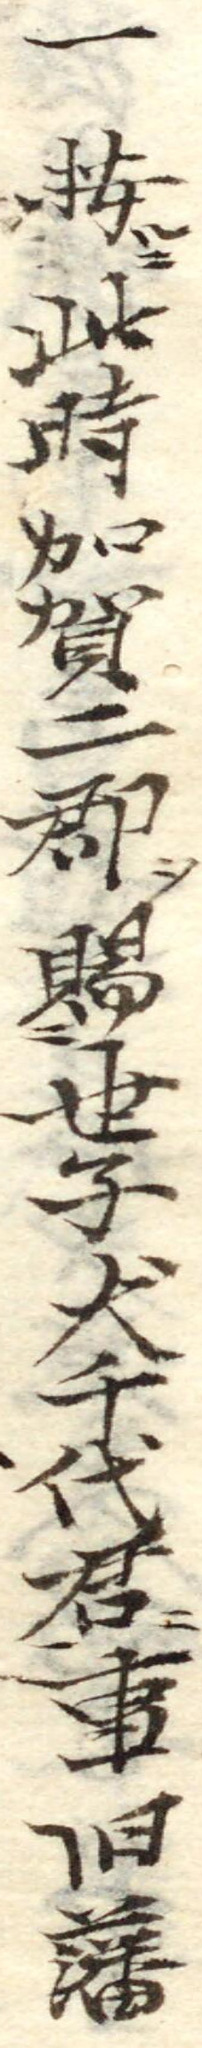一按るに此時加賀二郡を賜世子犬千代君に事旧藩
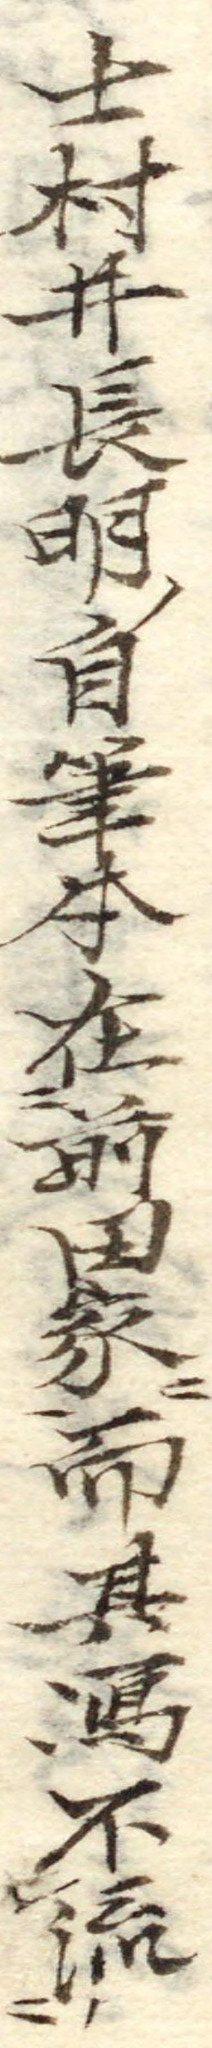士村井長明の自筆本在前田家に而其写不流
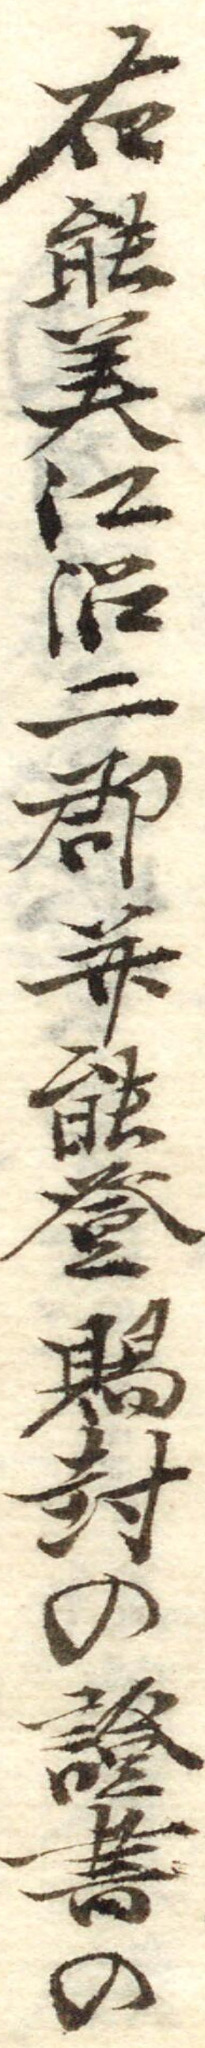右能美江沼二郡幷能登賜封の證書の
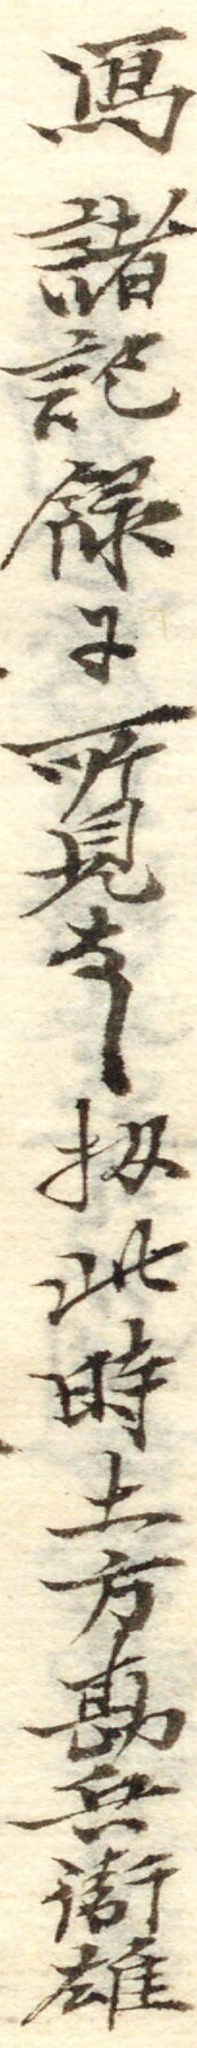写諸記録尓所見なし扨此時土方勘兵衛雄
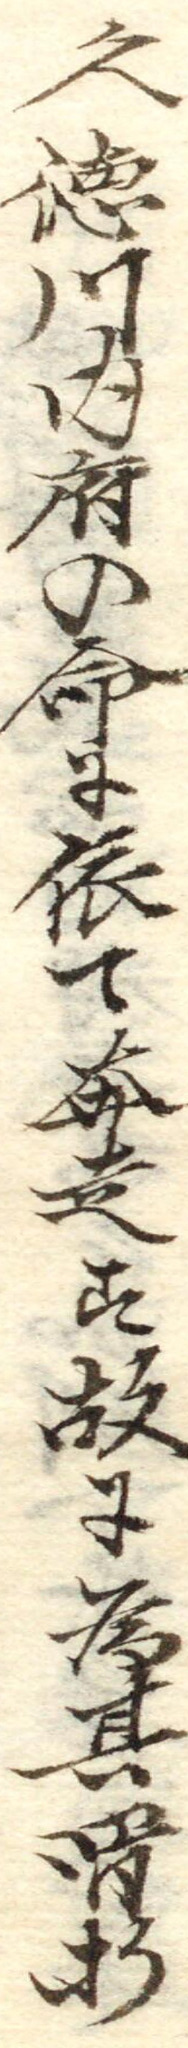久德川内府の命尓依て奔走春故尓為其骨折
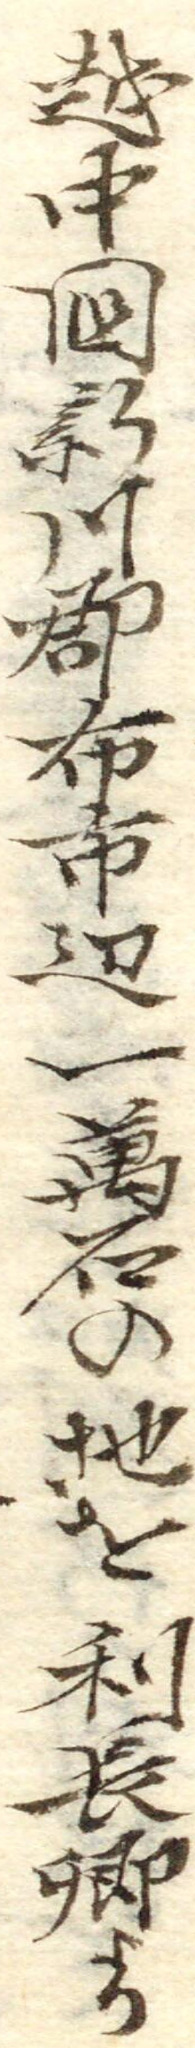越中国新川郡布市辺一萬石の地を利長卿より
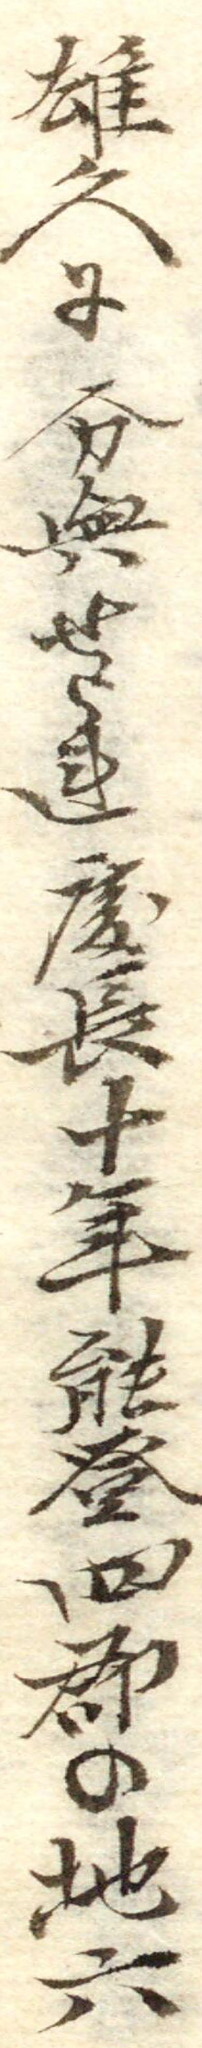雄久尓分與せら連慶長十年能登四郡の地六
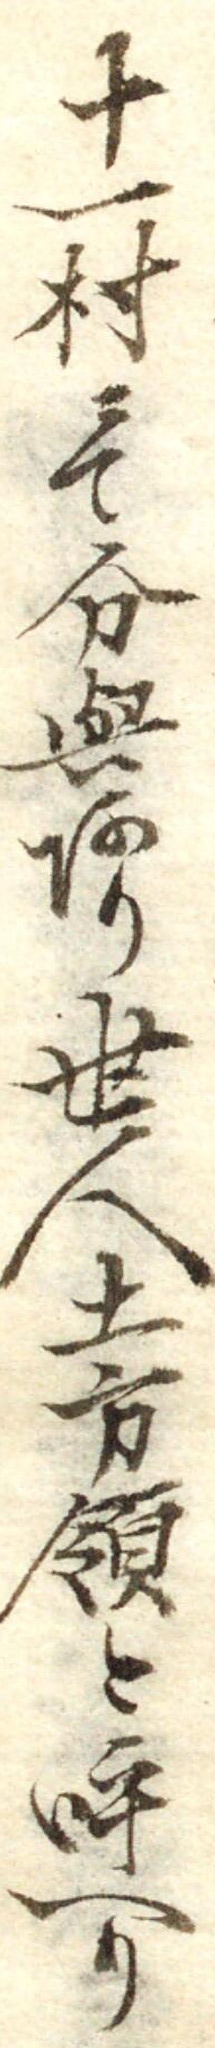十一村にて分與阿り世人土方領と呼へり
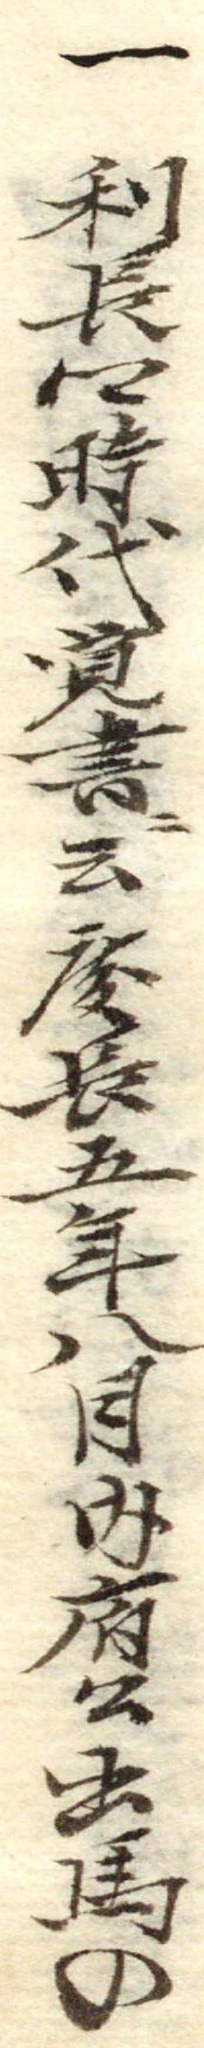一利長郷時代覚書に云慶長五年八月内府公出馬の

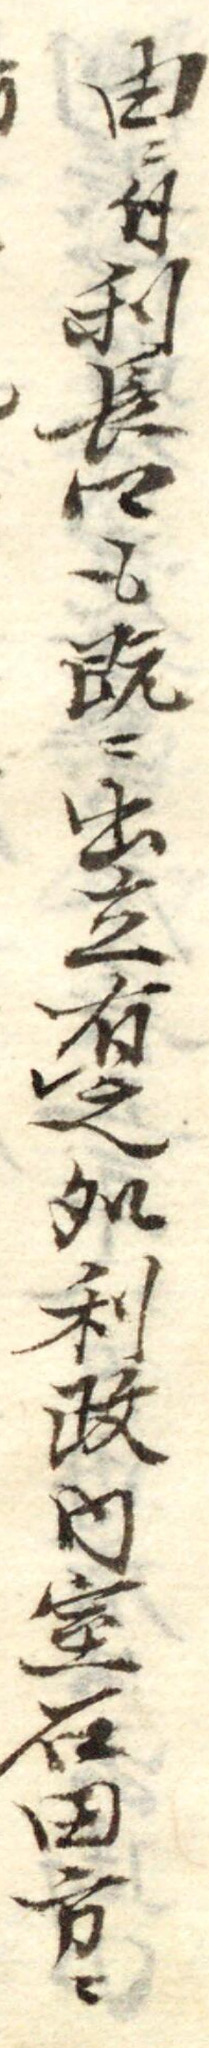由に付利長郷も既に出立有之処利政内室石田方に
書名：前田家封国証書集録
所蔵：Ishikawa Prefectural Library
